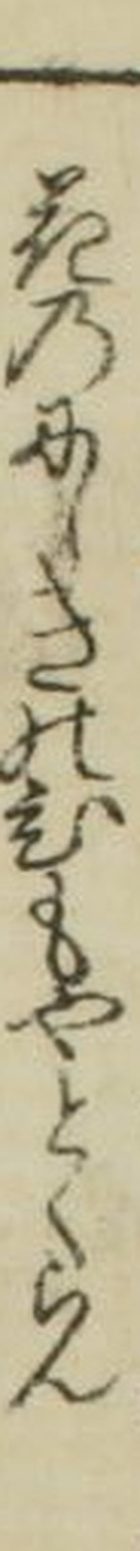花のにしきのひもやとくらん
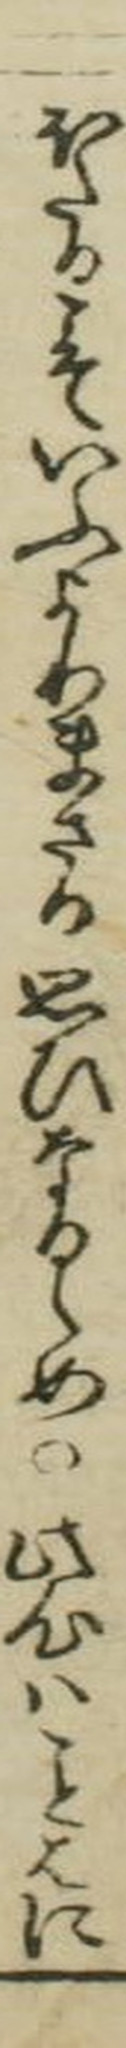ほたるこそいふよりまさる思ひなるらめ○此心はことはに
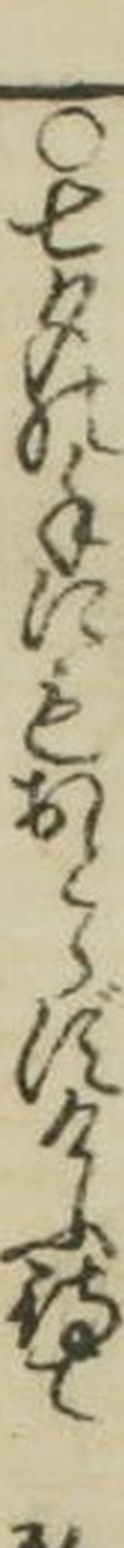○七夕の手にもおとらずけふ待て弘資
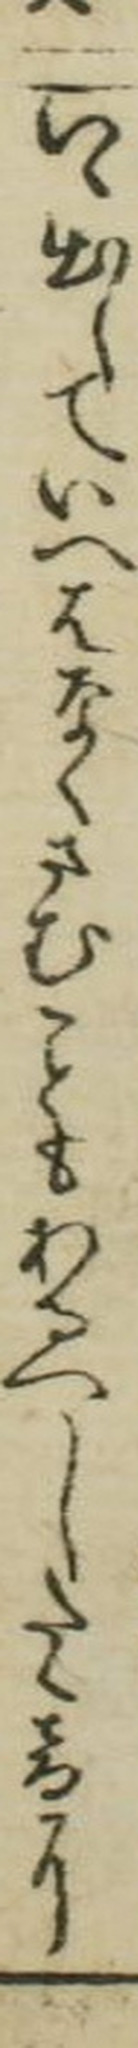いゝ出していへはなくさむこともあるへしたゝ音に
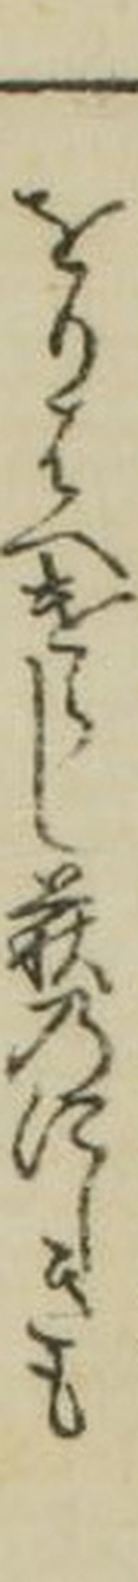をりはへけらし萩のにしきも
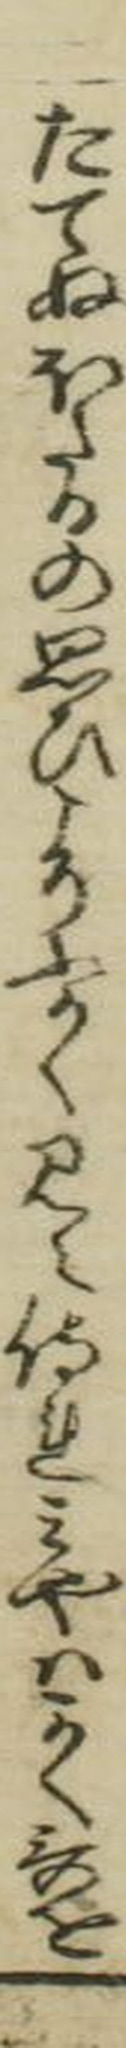たてぬほたるの思ひよりふかく見え侍れみやはかく哥を
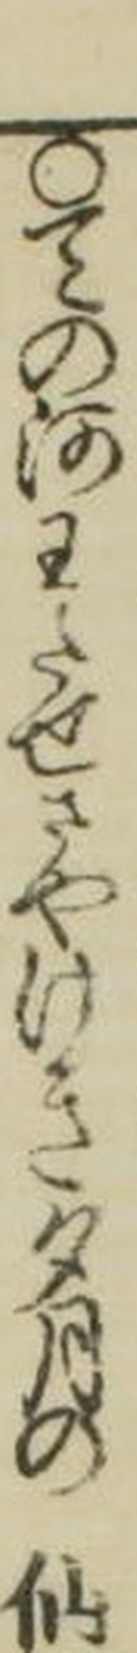○天の河わたせさやけき夕月の仙洞
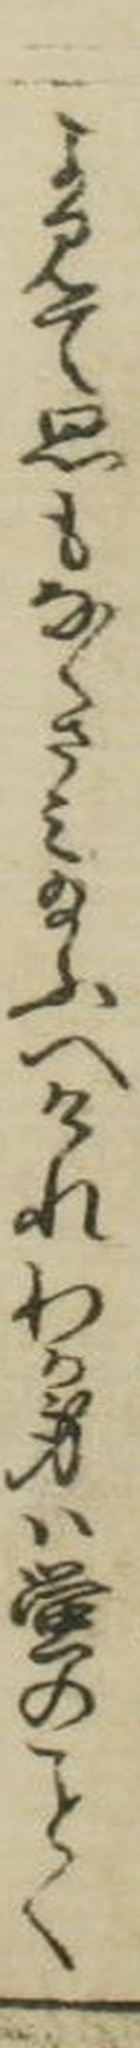よみて思もなくさみ給ふへけれわか身は蛍のことく
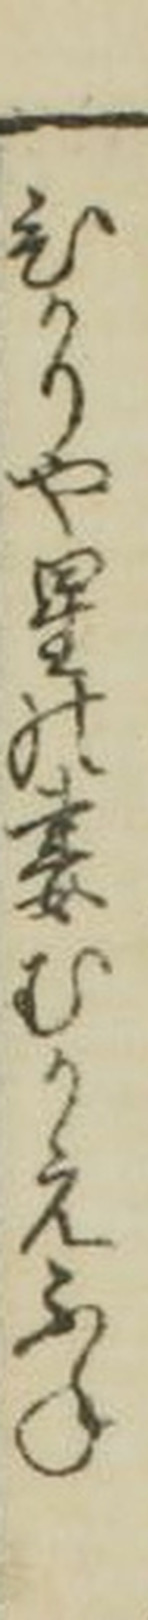ひかりや星の妻むかえふね
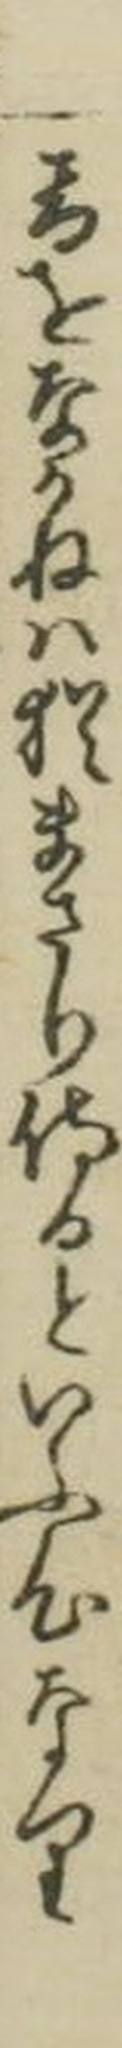音をなかねは猶まさり侍るといふ心なり
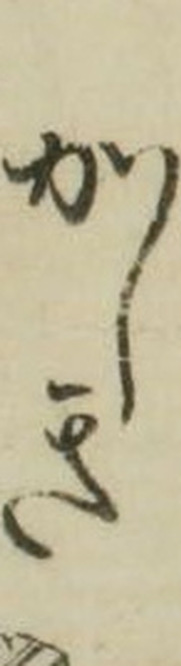かしき
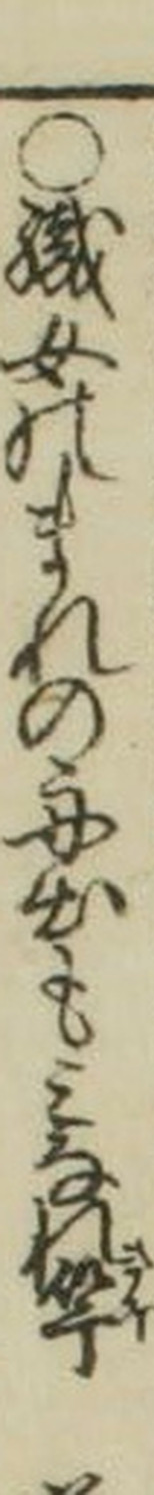○織女のまれの舟出もみなれ竿道晃
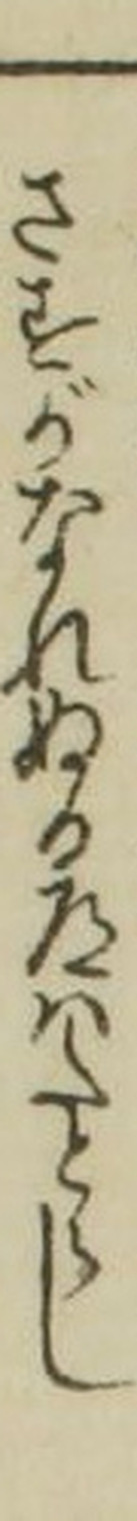さすがなれぬる道はたとらし
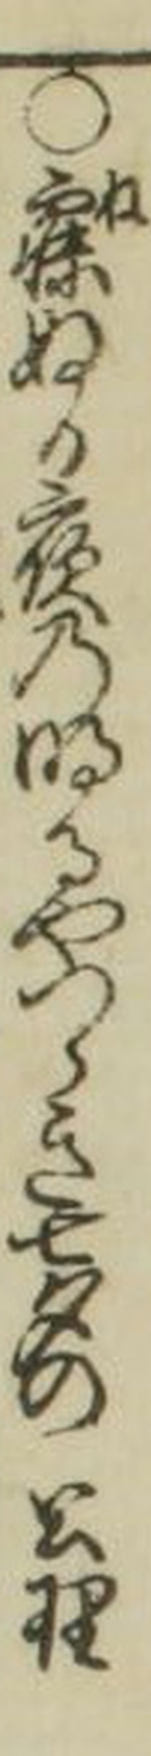○寐ぬる夜の明るやつらき七夕の公理
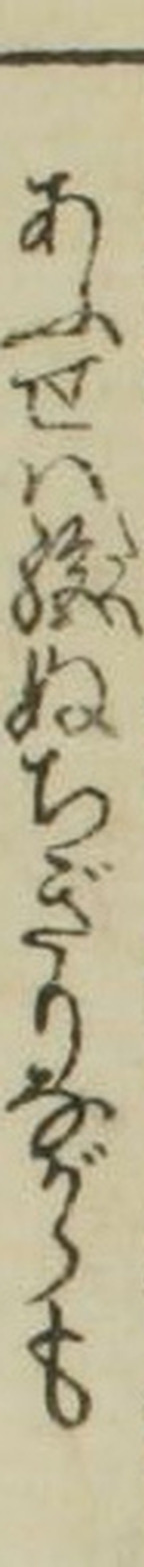あふせは絶ぬちぎりながらも
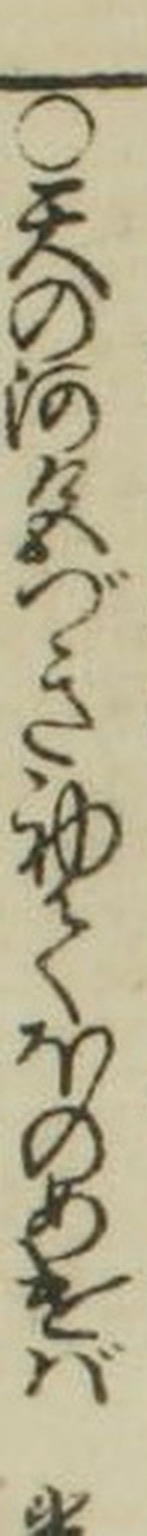○天の河色づき初てほのめけば光離
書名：女源氏教訓鑑
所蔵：東京学芸大学附属図書館
